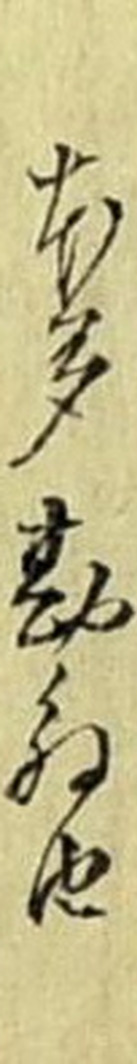本多勘解由
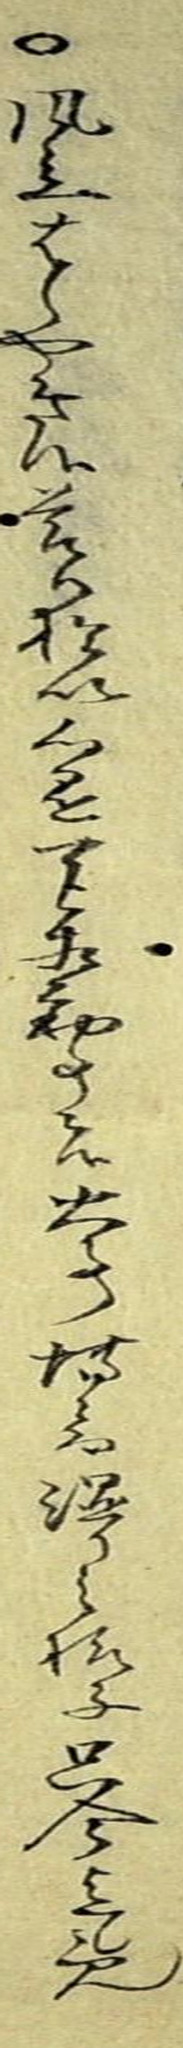〇風立はしやき候節ハ猶以心懸可被相勤事ニ候火事場ニ而湿り之様子只今迄も見
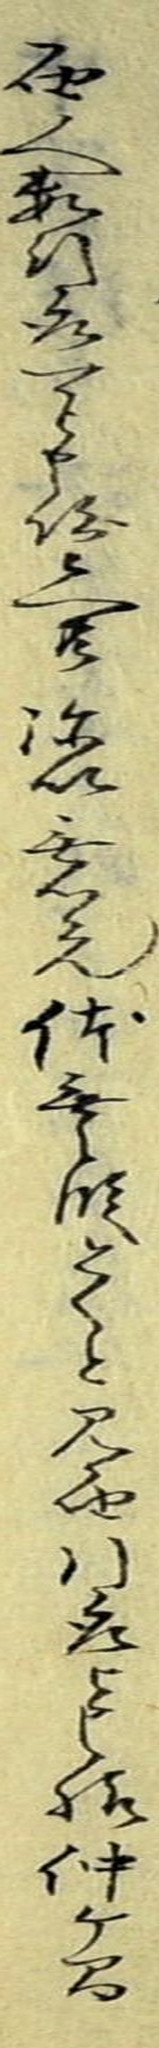届人数引取可被申儀ニ候へ共弥以無心元体無之段とくと見届引取被申候様仲ケ間

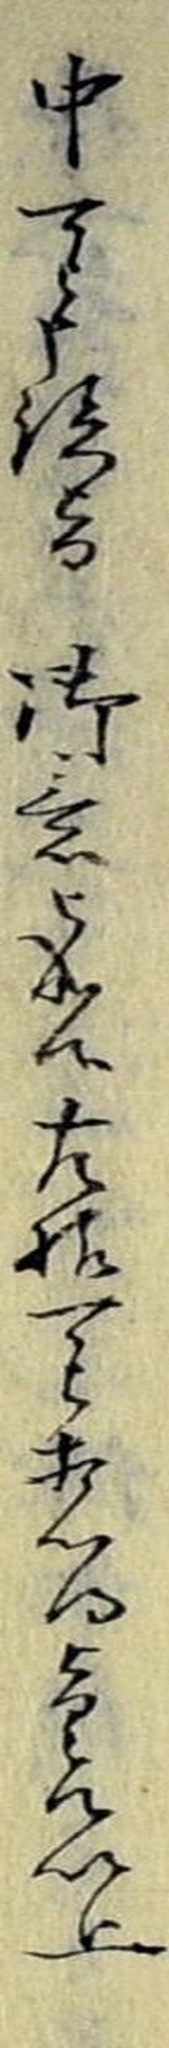中可被申談旨御意被成候左様可被相心得旨ニ候以上
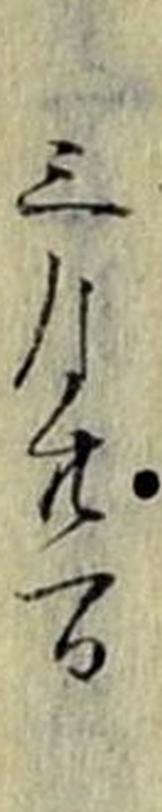三月廿一日
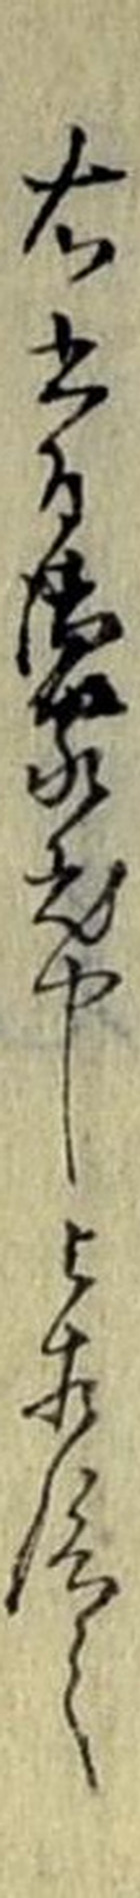右書付御家老中被相渡之
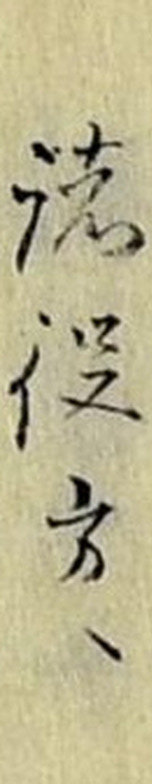諸役方へ
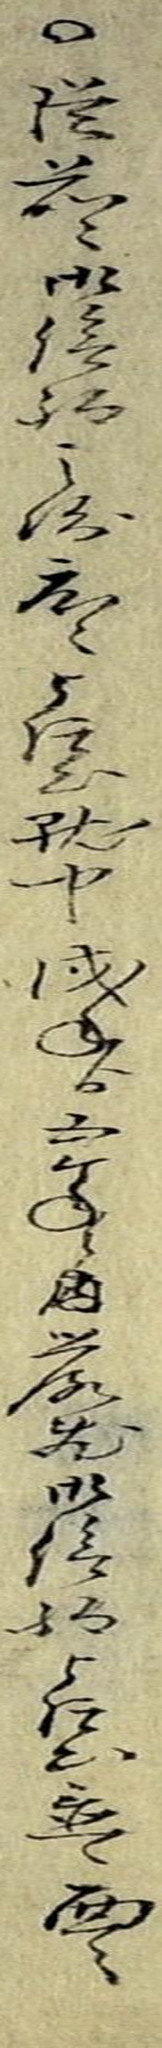〇従前々御倹約之儀度々被仰出就中戌年ゟ五ケ年之内厳敷御倹約被仰出置候面々
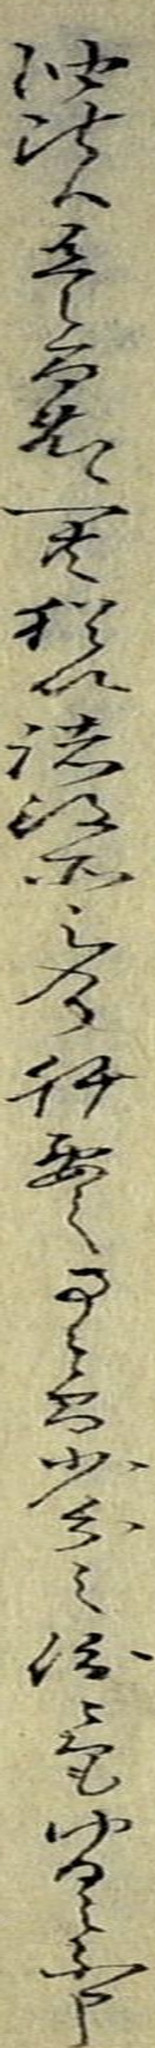油断ハ有之間敷候へ共猶以諸役所之〆り肝要之事ニ候間少分之儀ニ而もゆるみ不申
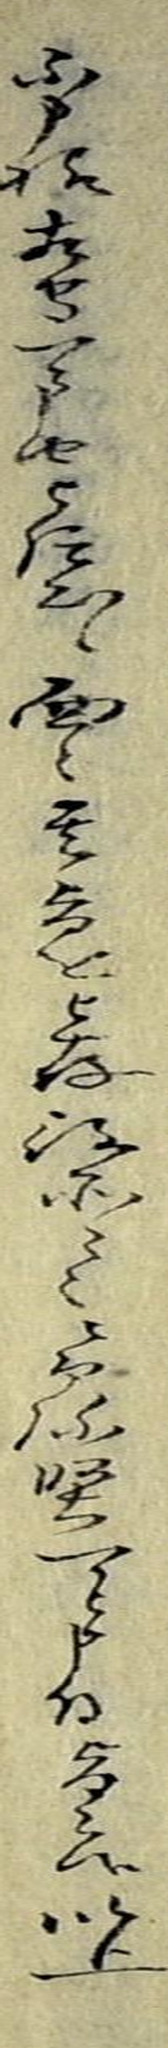不申様相守可申由被仰出候面々其旨を被存役所々々ニ而弥堅可被申付旨ニ候以上
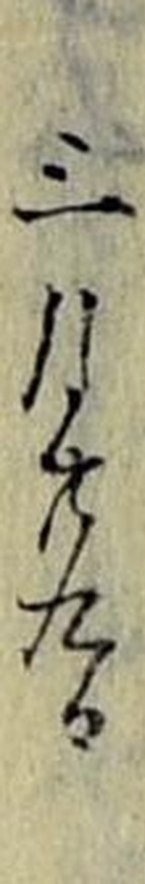三月廿九日
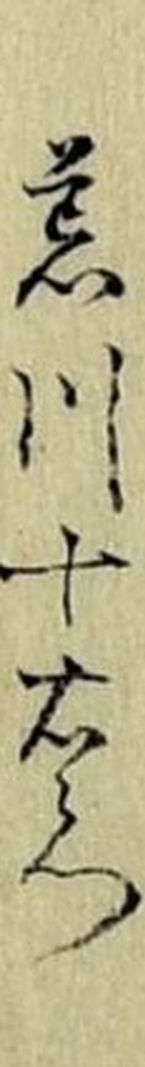荒川十右衛門
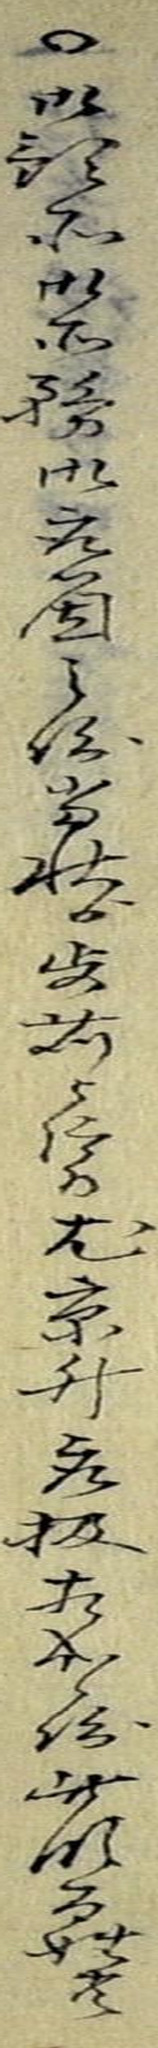〇御預所御所務御取箇之儀当秋ゟ歩苅被仰付尤京升取扱相成候儀此段百姓共
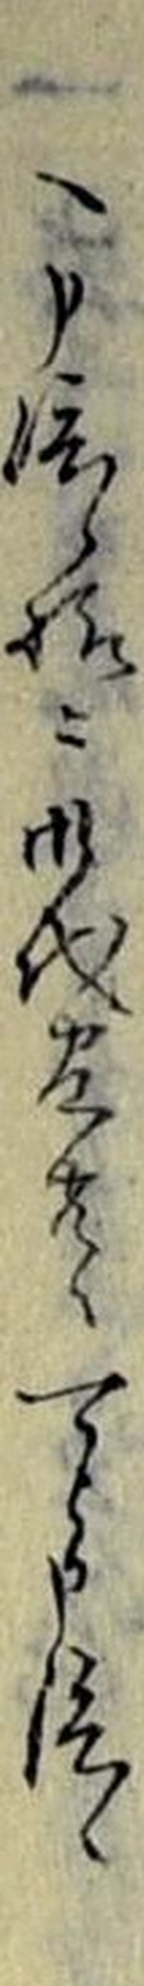へ申渡候様ニ御代官共へ可被申渡候
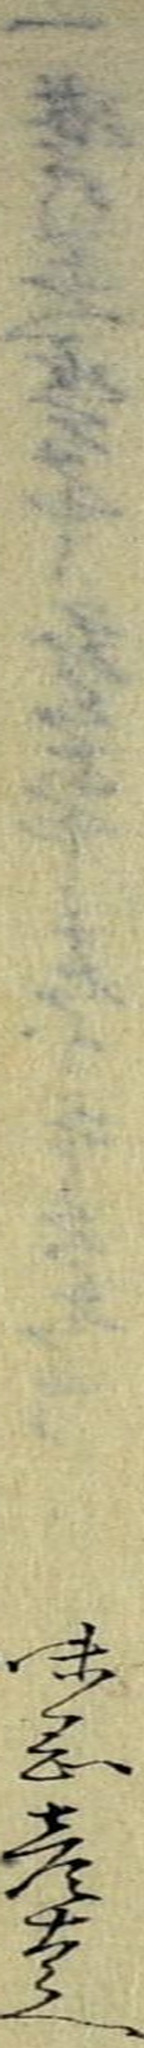味岡彦大夫
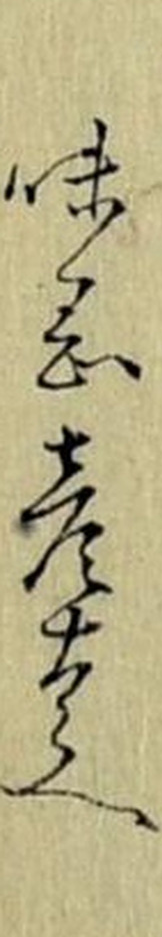味岡彦大夫
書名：命令之部 一
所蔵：福井県文書館 Fukui Prefectural Archives
